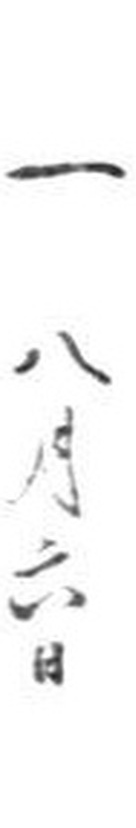一八月六日
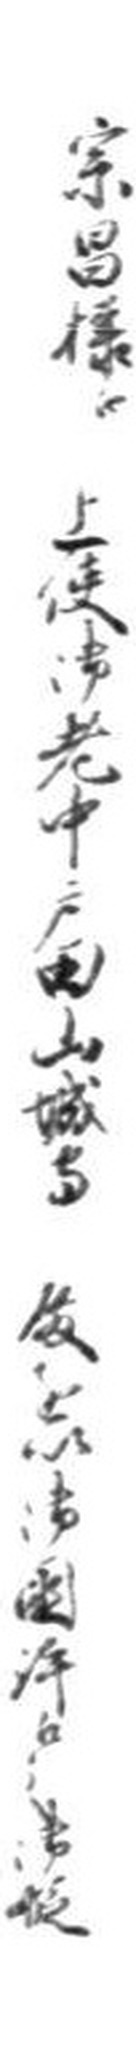宗昌様江上使御老中戸田山城守殿を以御国許江之御従
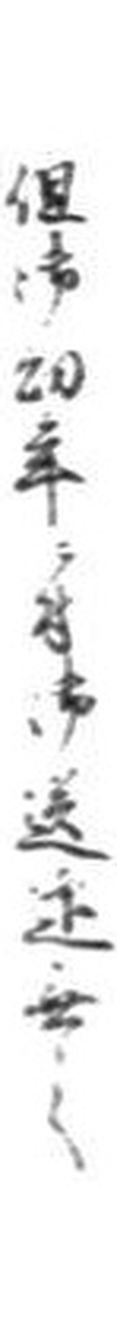但御幼年ニ付御送迎無之
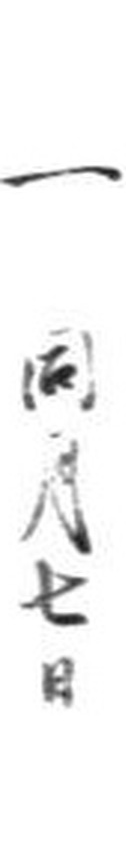一同月七日
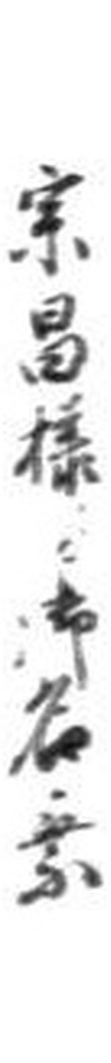宗昌様与御名乗
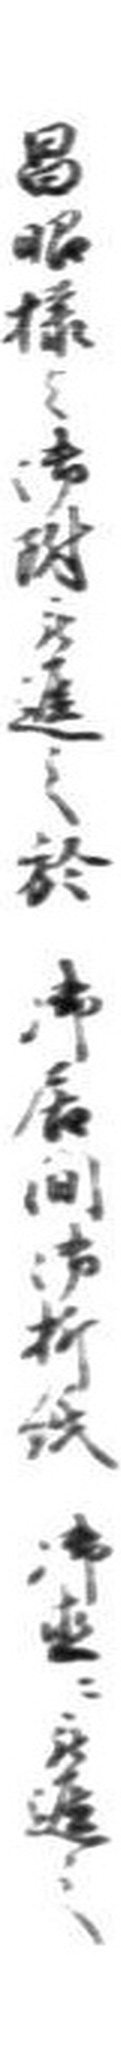昌昭様与御附被進之於御居間御折紙御直ニ被進之
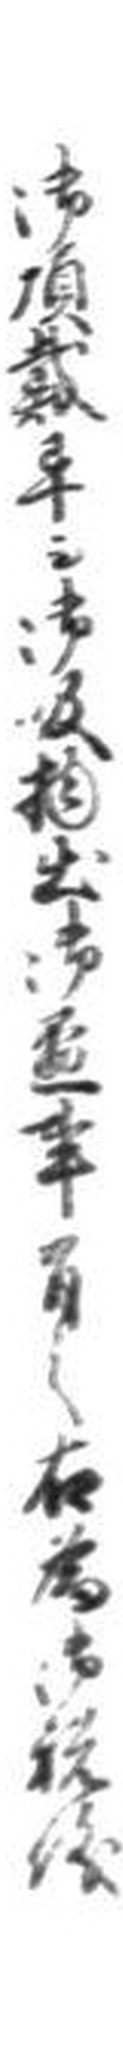御頂戴畢而御吸物出御盃事有之右為御祝儀
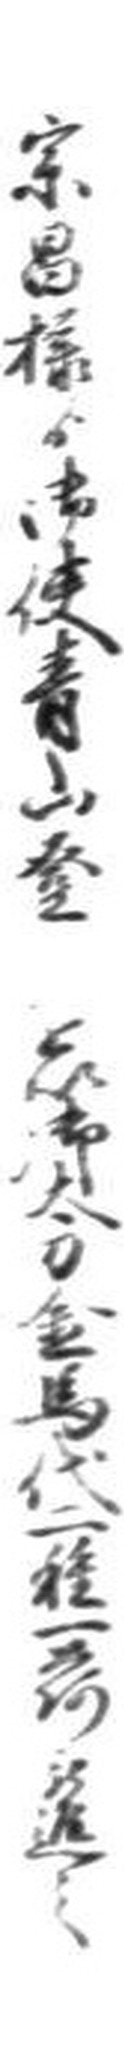宗昌様ゟ御使青山登を以御太刀金馬代一種一荷被進之
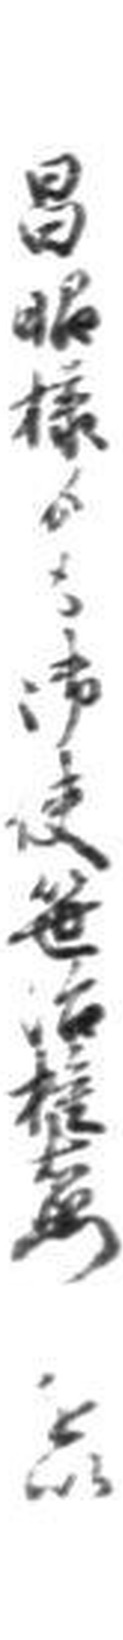昌昭様ゟも御使笹治権右衛門を以
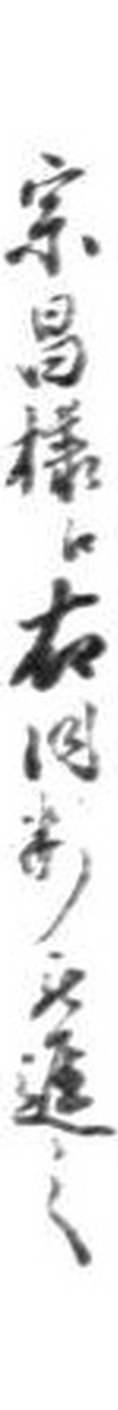宗昌様江右同断被進之
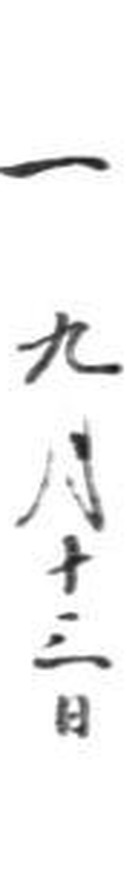一九月十三日

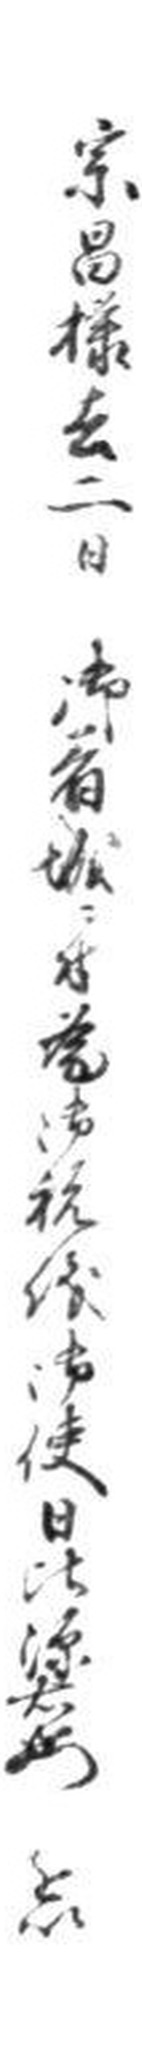一宗昌様去二日御着城ニ付為御祝儀御使日比源右衛門を以
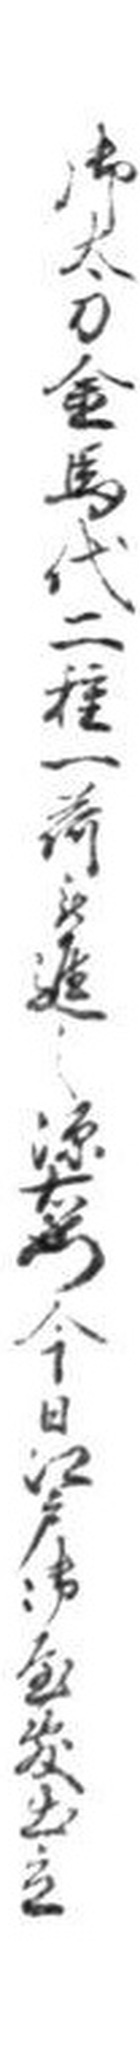小太刀金馬代二種一荷被進之源右衛門今日江戸御屋敷出立
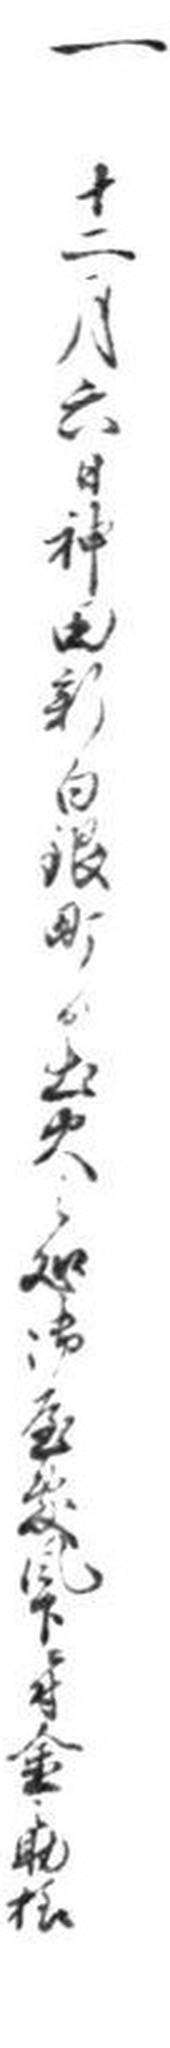一十二月六日神田新白銀町ゟ出火之処御屋敷風下ニ付金之助様
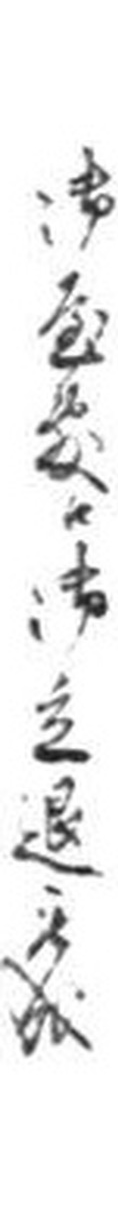御屋敷江御立退被成
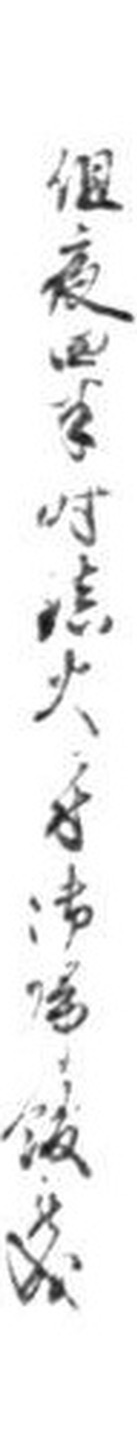但夜四半時鎮火ニ付御帰館被成
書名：家譜 三十七 宗矩公 従正徳五年到享保九年五月
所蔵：福井県文書館 Fukui Prefectural Archives
